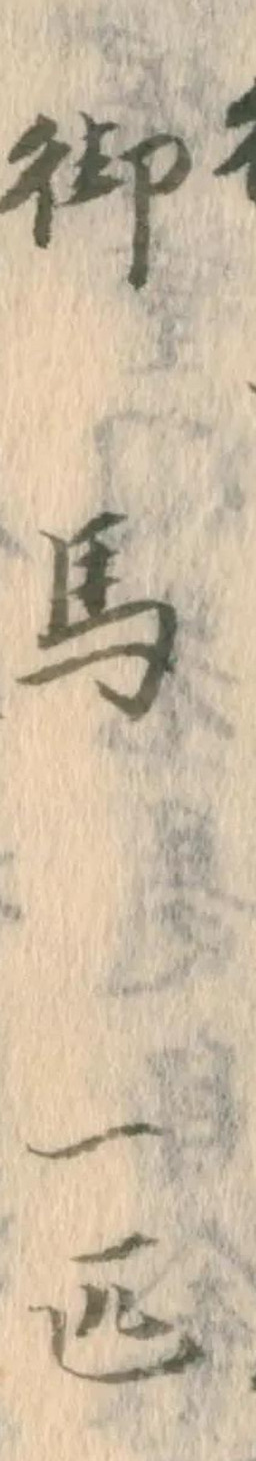御馬一匹
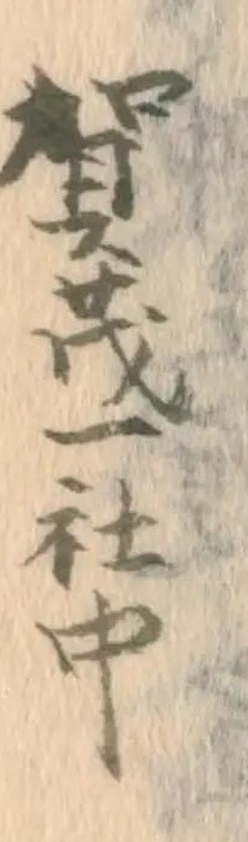賀茂一社中
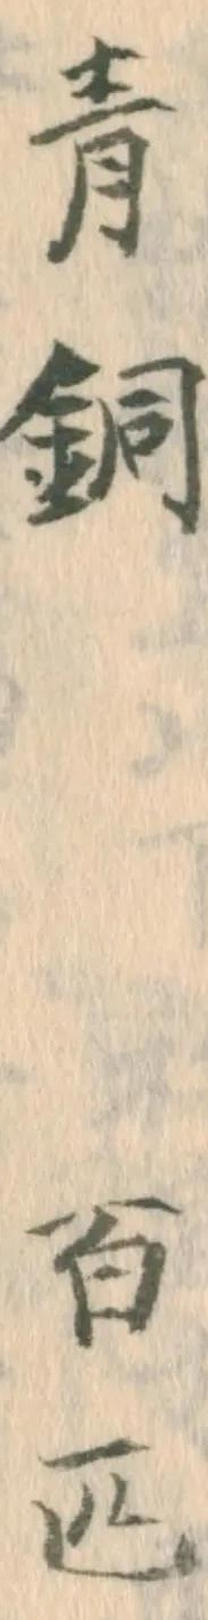青銅百匹
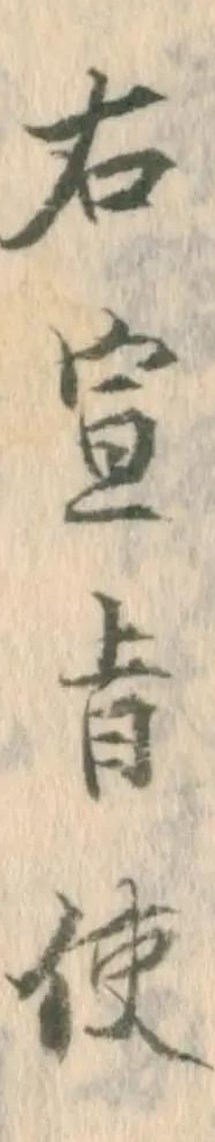右宣旨使
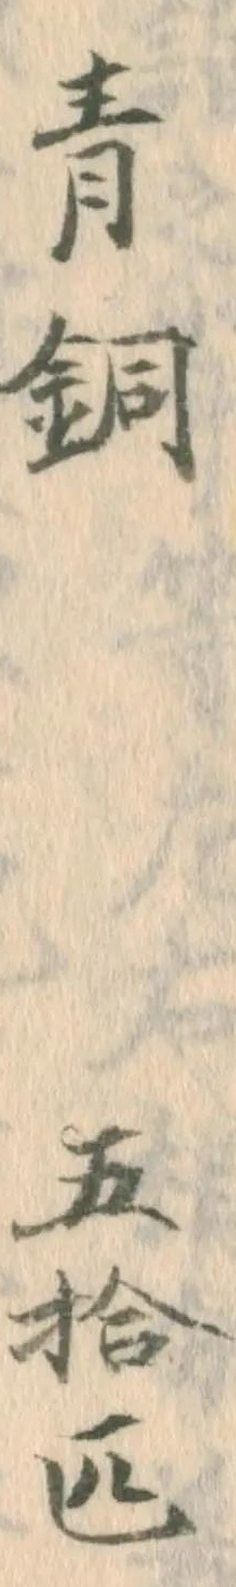青銅五拾匹
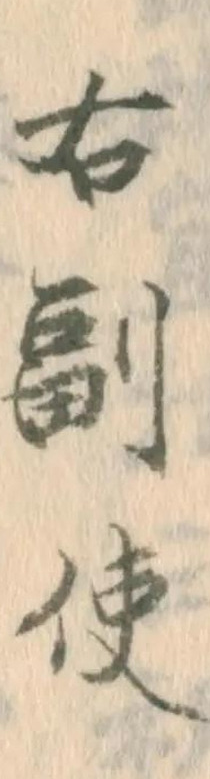右副使
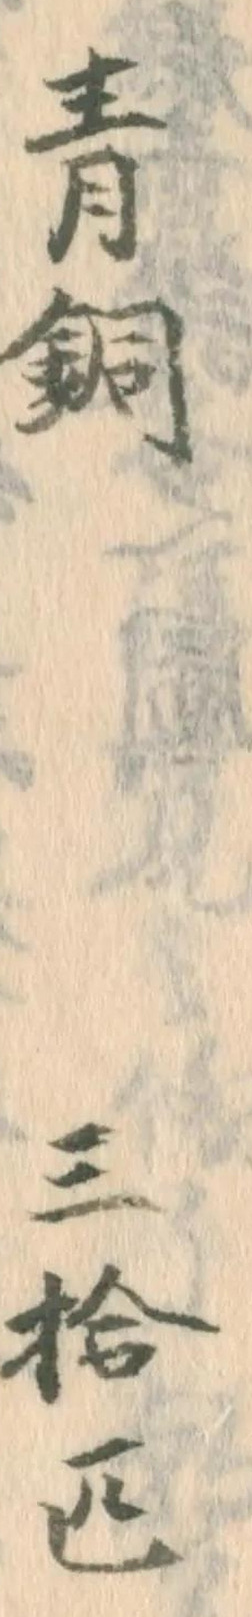青銅三拾匹
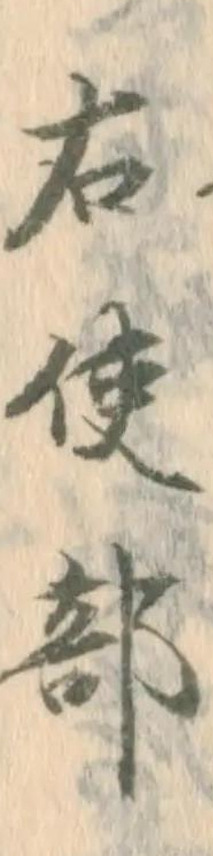右使部
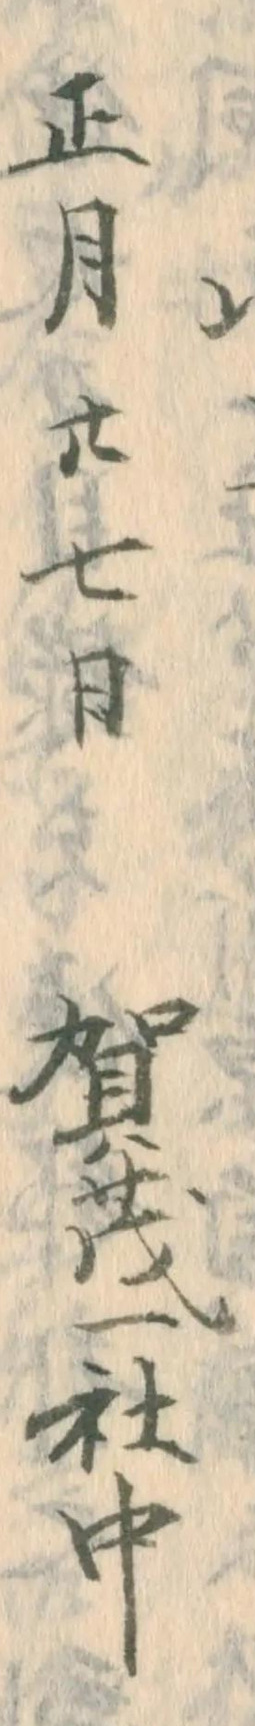正月廿七日賀茂一社中
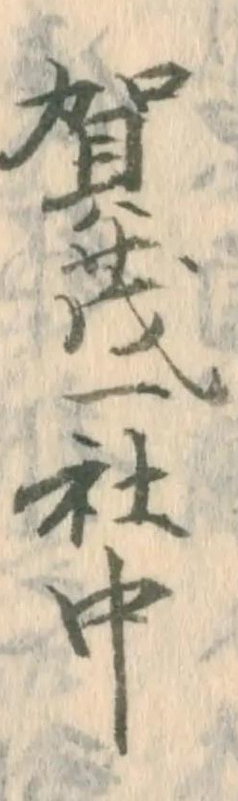賀茂一社中

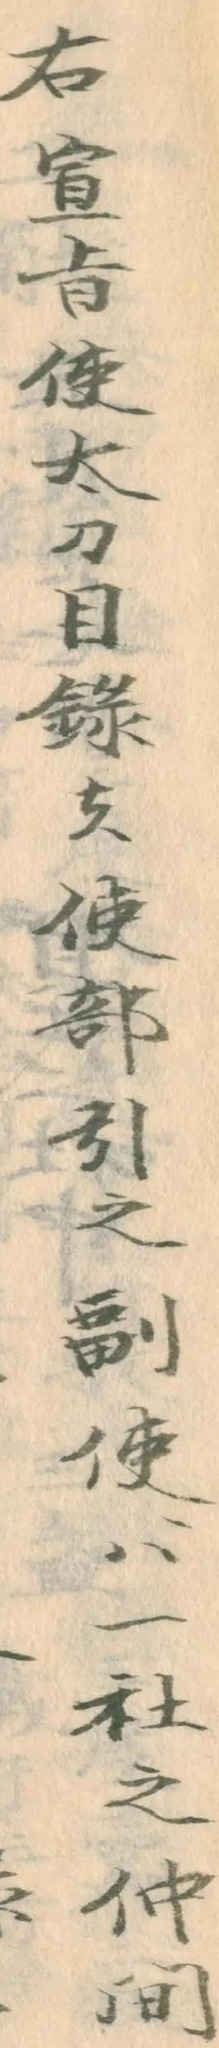右宣旨使太刀目録は使部引之副使ヘハ一社之仲間
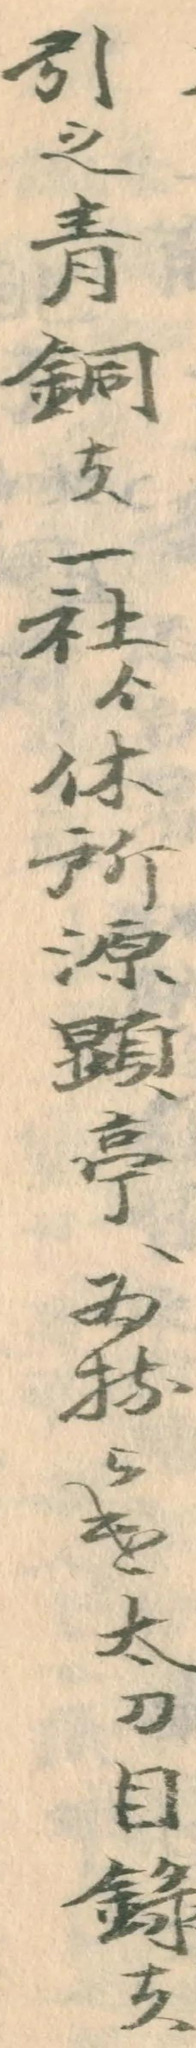引之青銅は一社ゟ休所源顕亭へ為持被遣太刀目録は
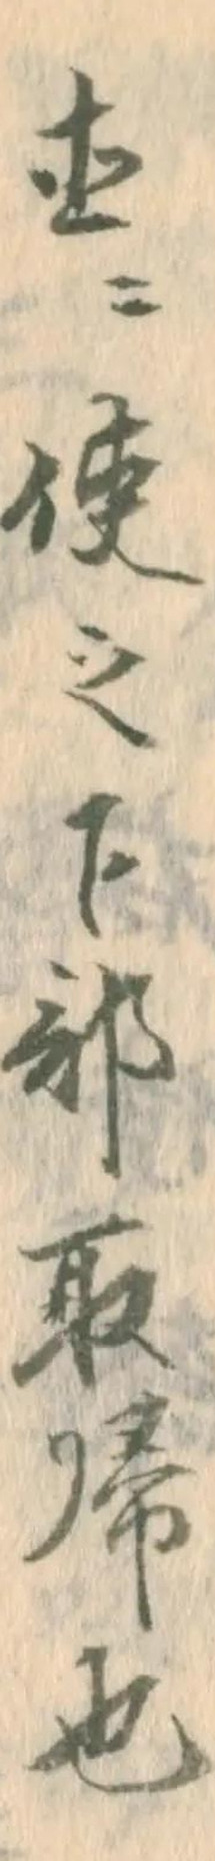直ニ使之下部取帰也
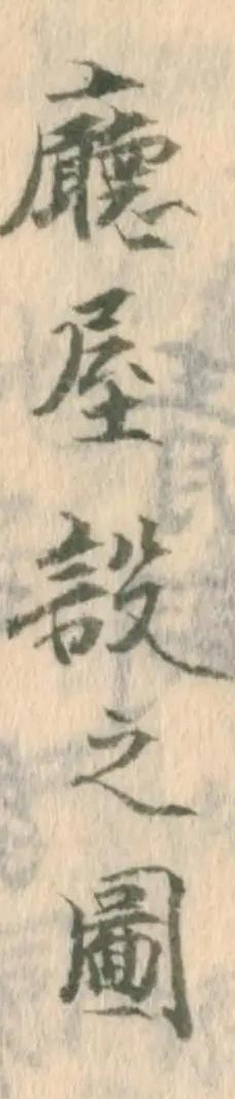庁屋設之図
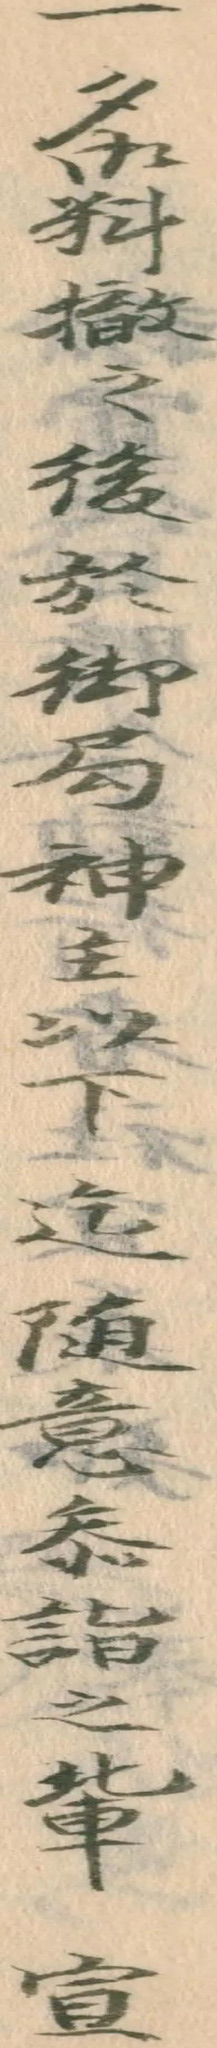一夕御料撤之後於御局神主以下迄随意参詣之輩宣
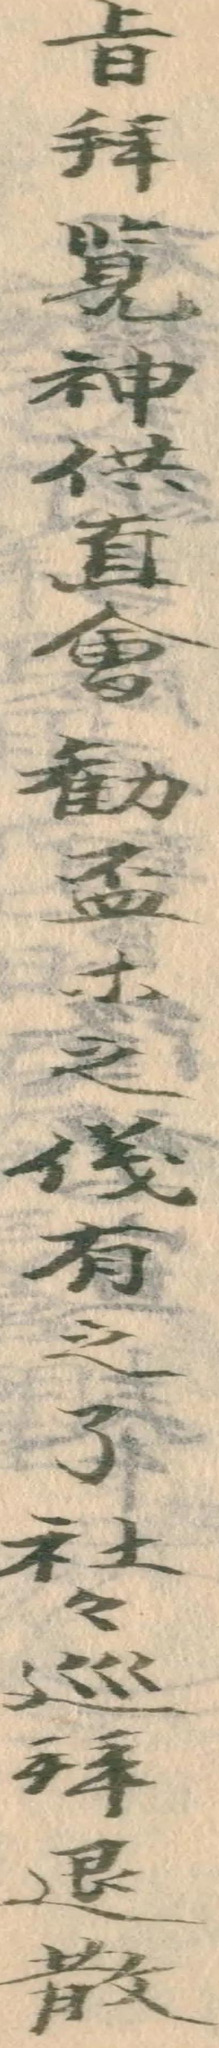旨拝覧神供直会勧盃等之儀有之了社々巡拝退散
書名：賀茂社記録. 第17冊
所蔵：国立国会図書館 National Diet Library, JAPAN
